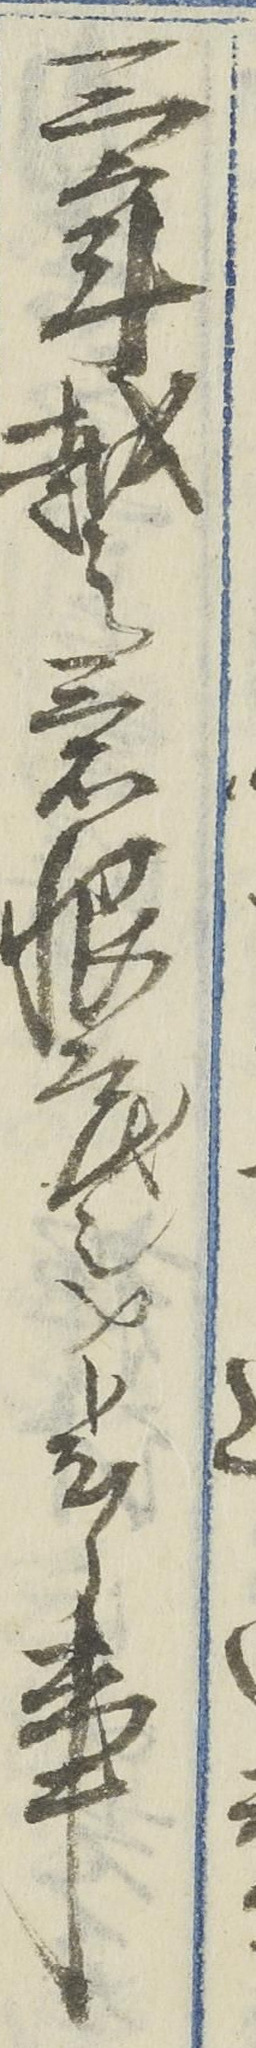三年越之意恨戻シヲト云う事

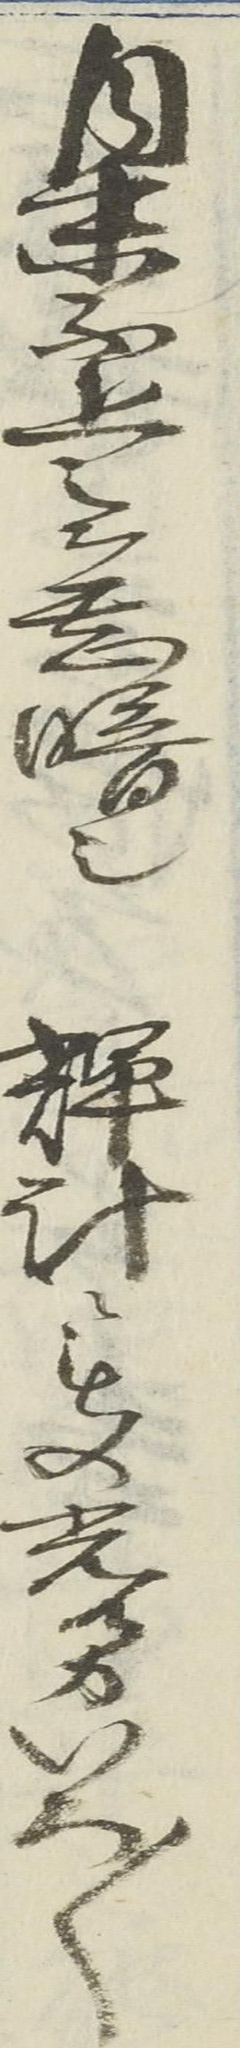月末不上ニテ甚暗シ輝計ニもの光ルカいろ〳〵
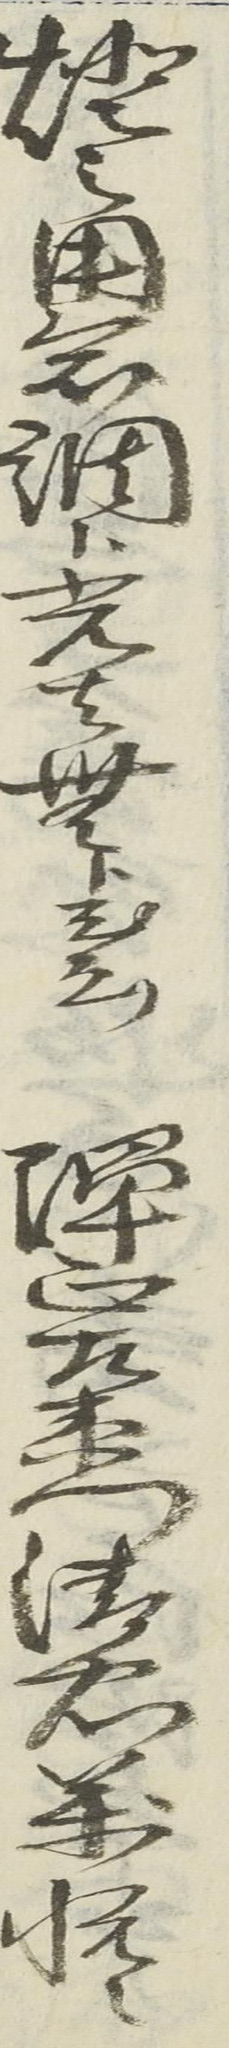燈之用意調ト光は無ト云云彈正左衛門清忠万悦ニ
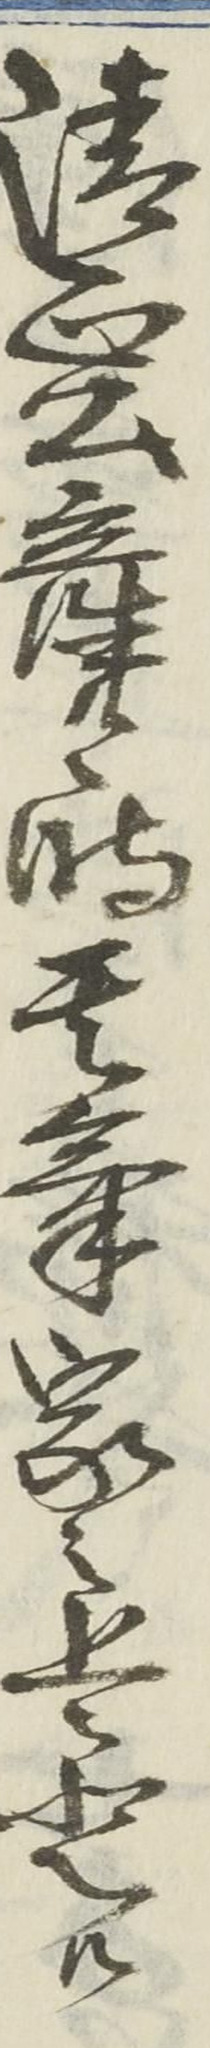清正公産ルヽ時其気家之上ニ登ル
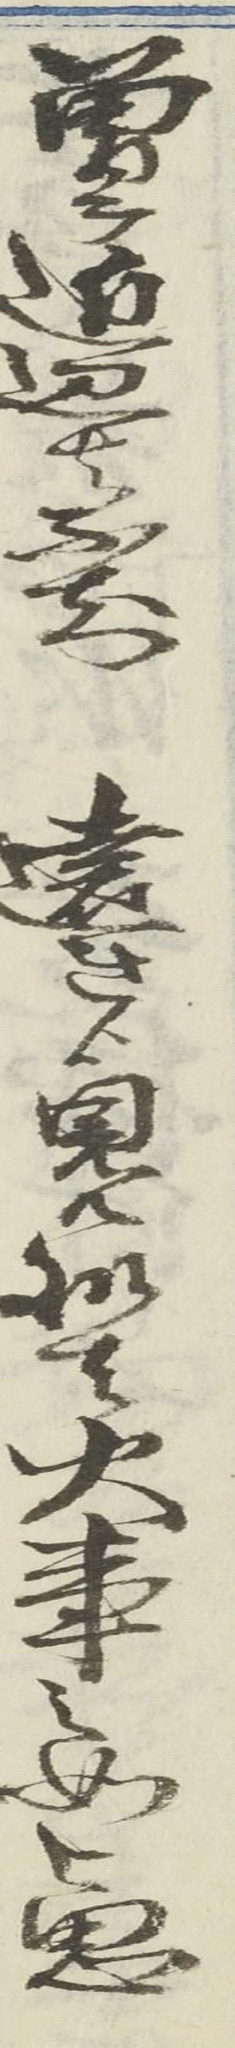曽テ近辺は不知遠きゟ見ル処は火事之如く被思
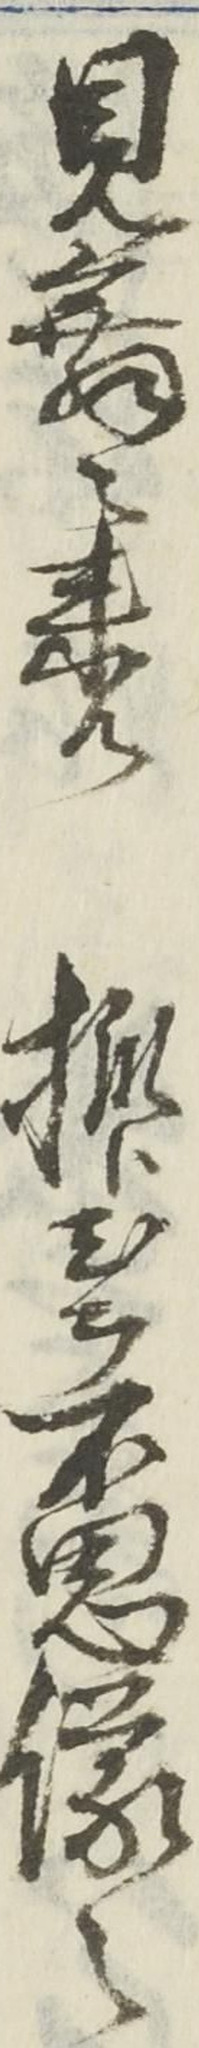見舞ニ来ル狐ト云云不思議之
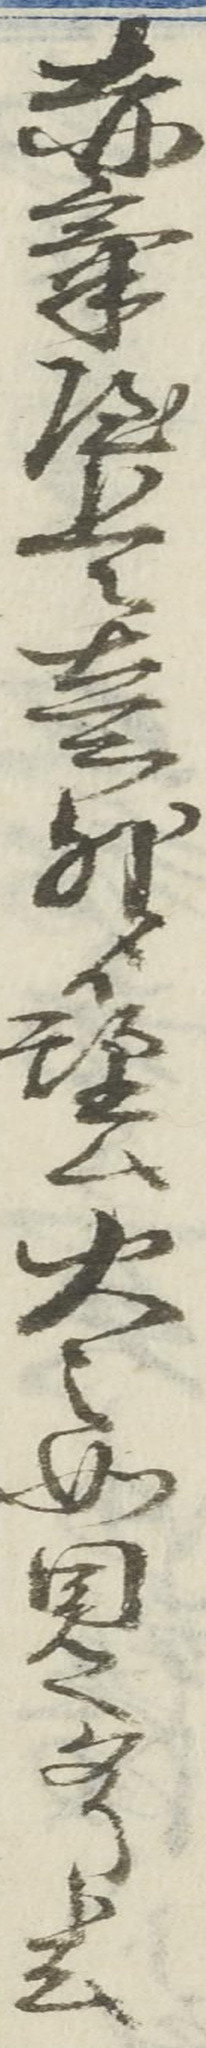赤気屋上ニ走外ゟ望ム火之如見へたりト云
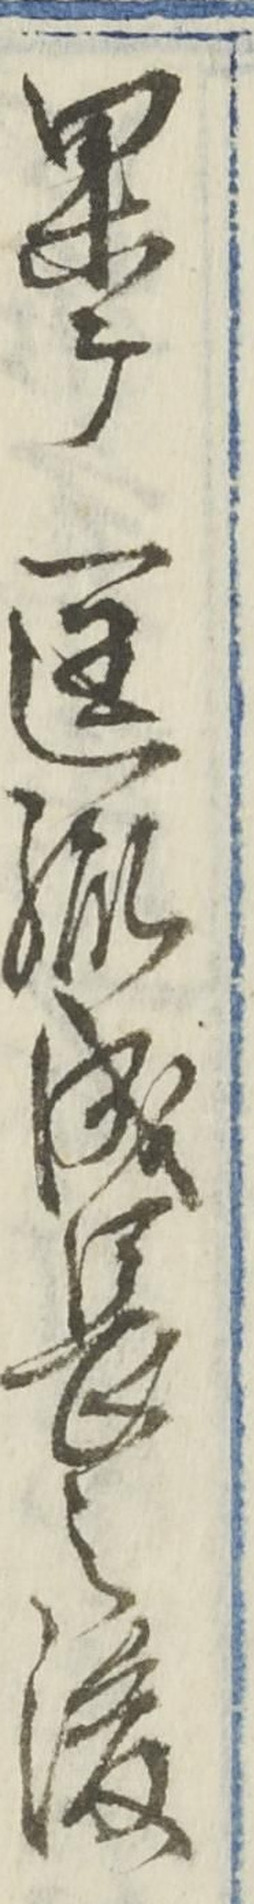果テ匡胤成長之後
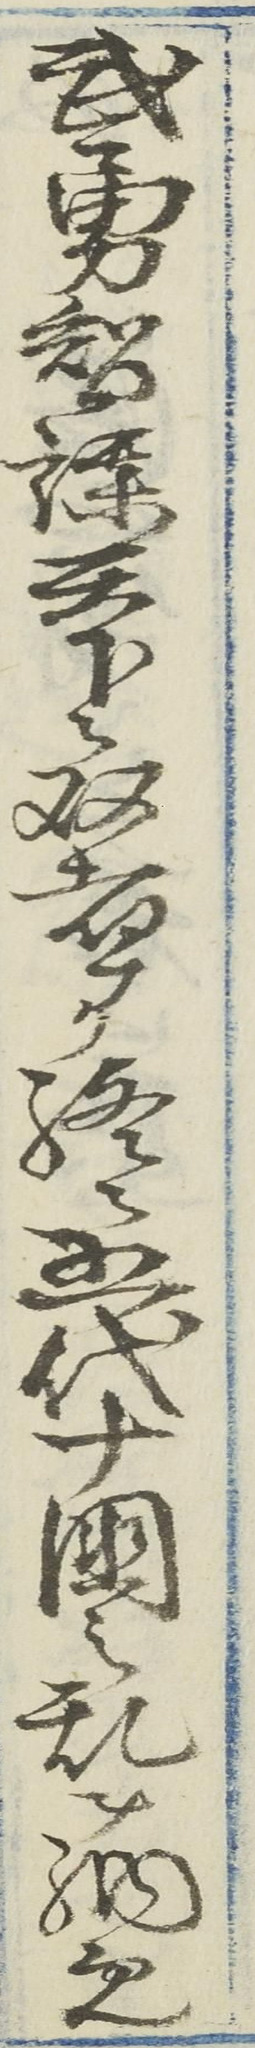武勇智謀天下之双者ナリ終ニ五代十国之乱ヲ納め
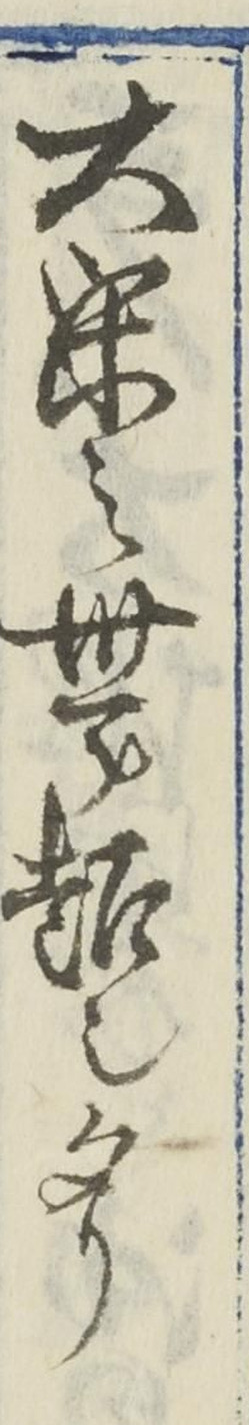大宋之世ヲ起シタリ
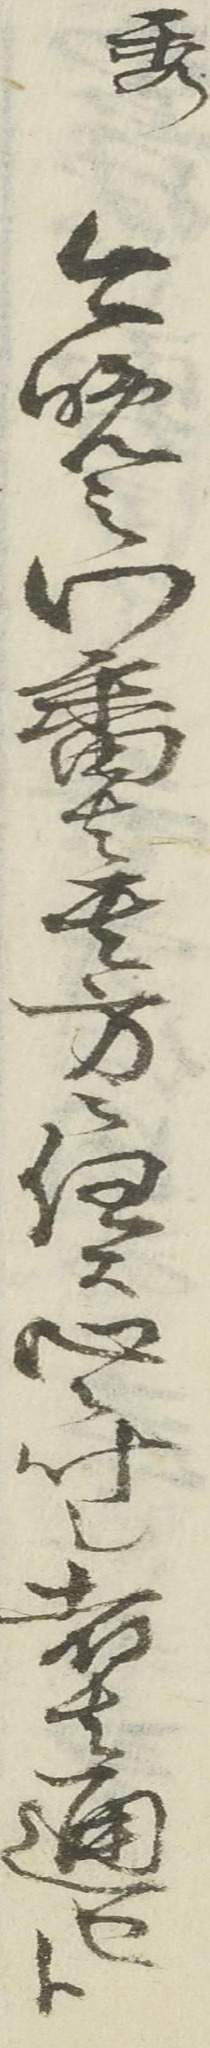秀今晩之門番は其方ニ任ス心ニ叶し者は通セト
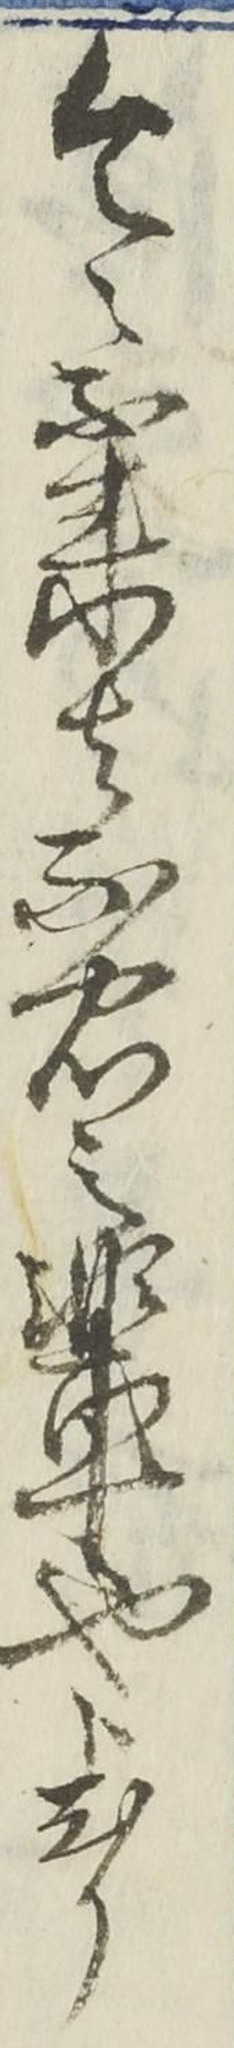今之不参は不忠之輩也ト云う
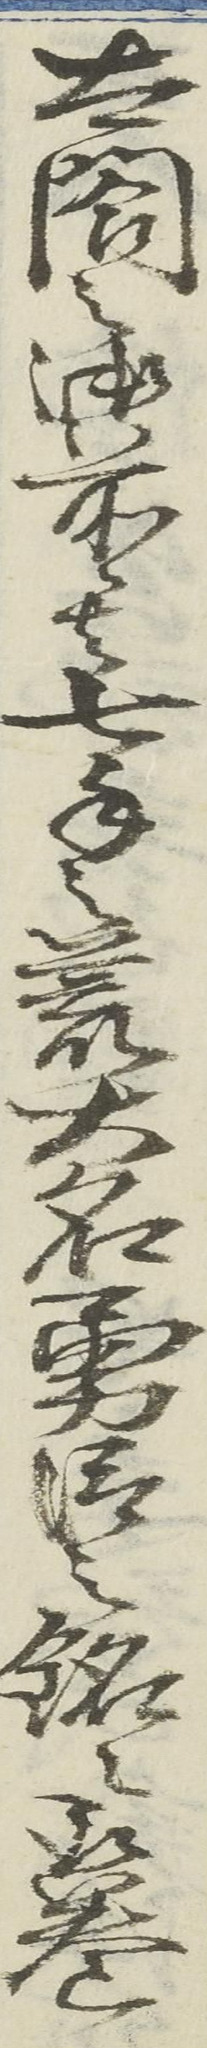太閤之御前は七手之荒大名勇臣之銘々取巻
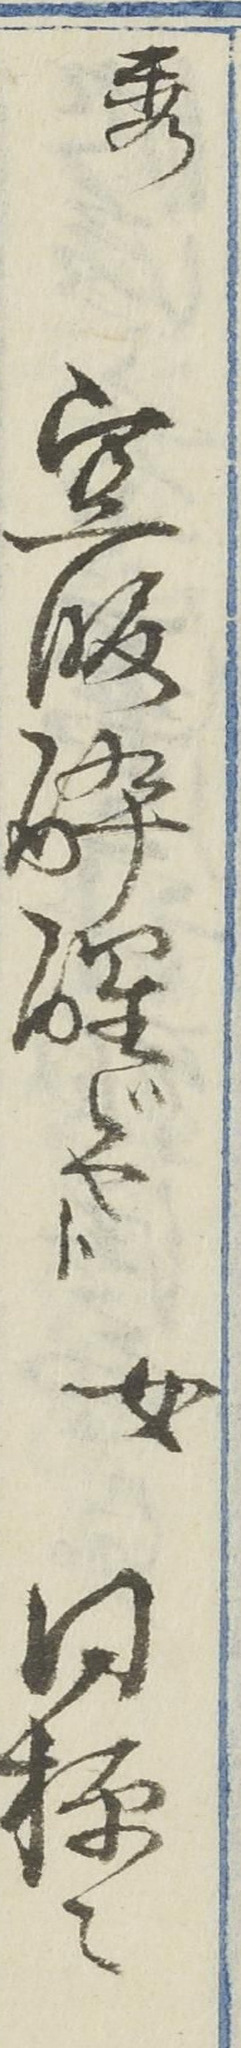秀空飯酔醒じゃト女同様ニ
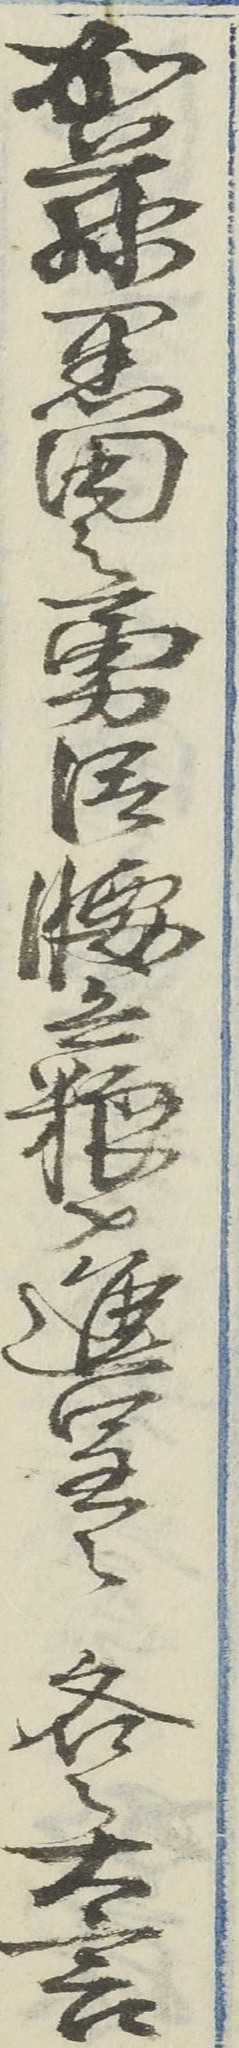加藤黒田之勇臣腰兵粮ヲ進呈シ各々太言
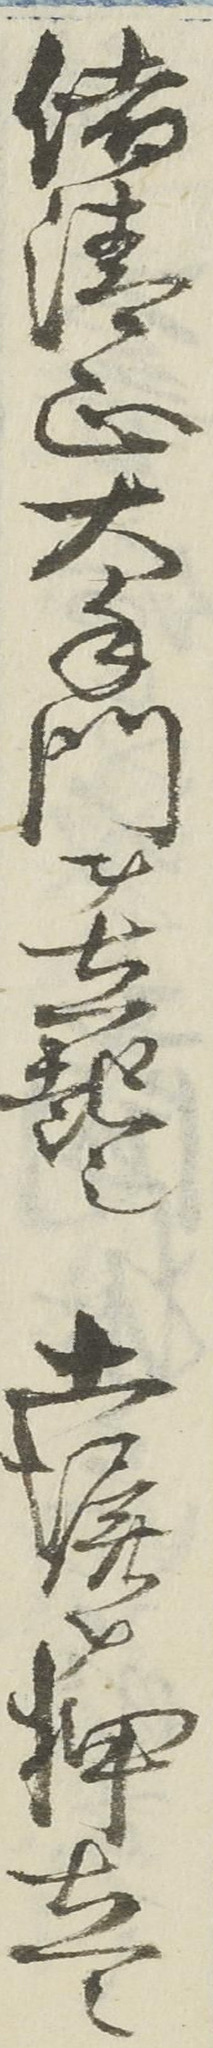偖清正大手門ヲ立起シ土塀ヲ押立し
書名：伏水大地震
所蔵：東京大学地震研究所図書室 Earthquake Research Institute Library, The University of Tokyo, JAPAN
